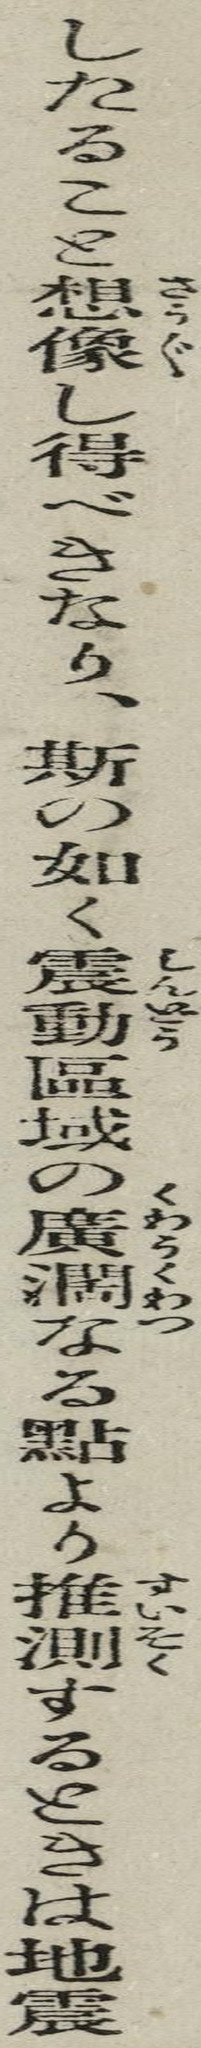したること想像し得べきなり、斯の如く震動區域の廣濶なる點より推測するときは地震
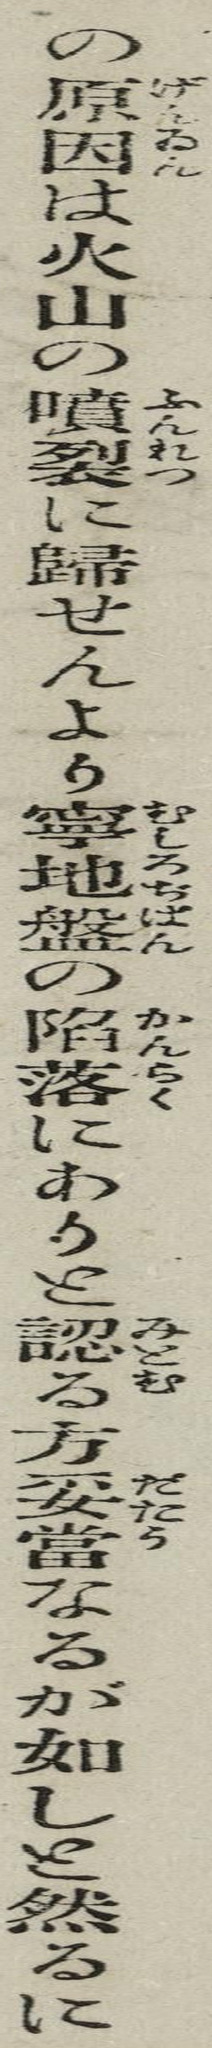の原因は火山の噴裂に歸せんより寧地盤の陥落にありと認る方妥當なるが如しと然るに
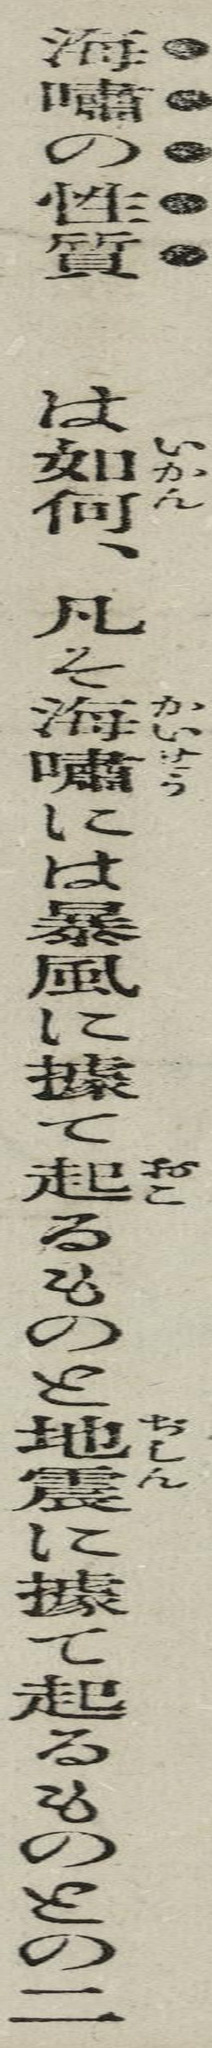海嘯の性質は如何、凡そ海嘯には暴風に據て起るものと地震に據て起るものとの二
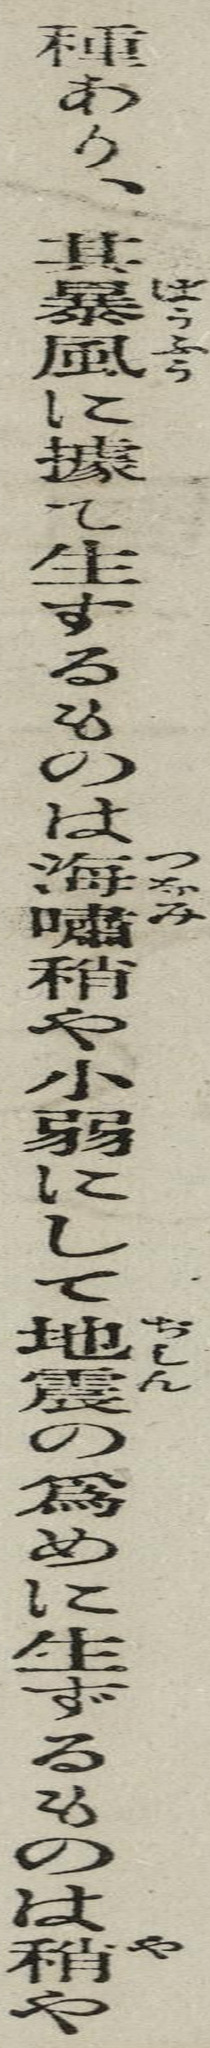種あり、其暴風に據て生するものは海嘯稍や小弱いにして地震の爲めに生ずるものは稍や
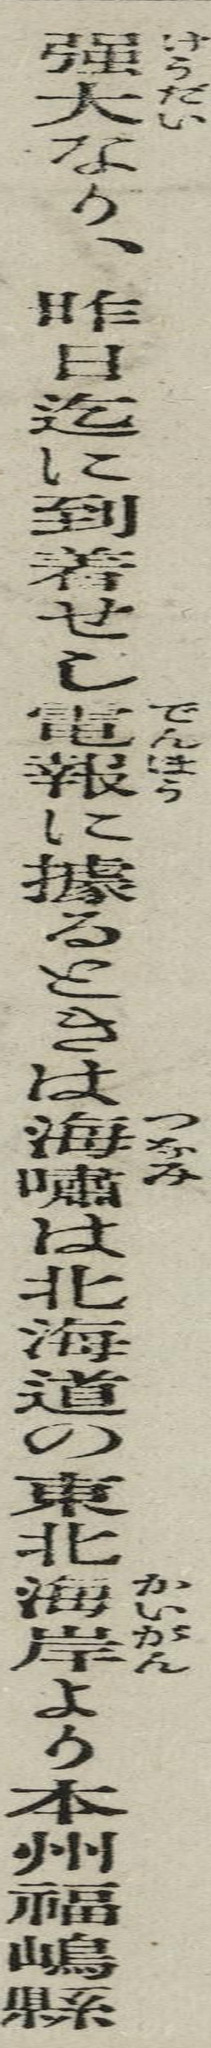强大なり、昨日迄に到着せし電報に據るときは海嘯は北海道の東北海岸より本州福嶋縣
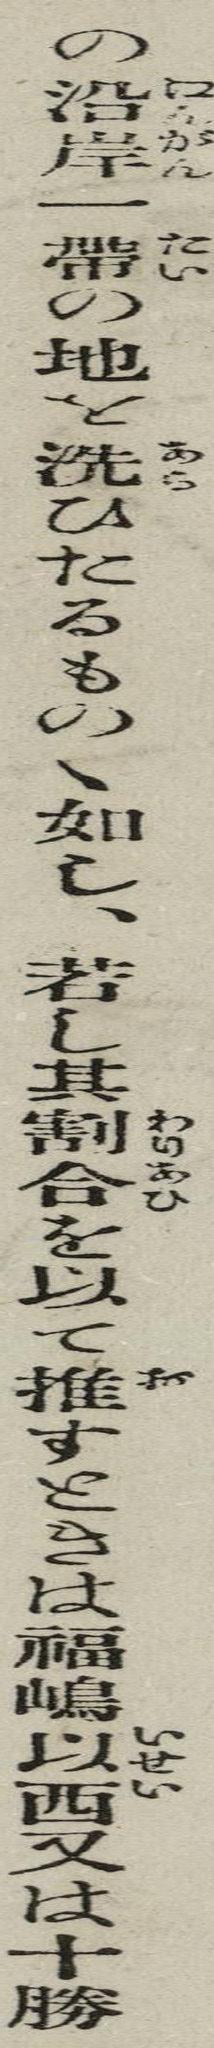の沿岸一帯の地を洗ひたるものヽ如し、若し其割合を以て推すときは福嶋以西又は十勝
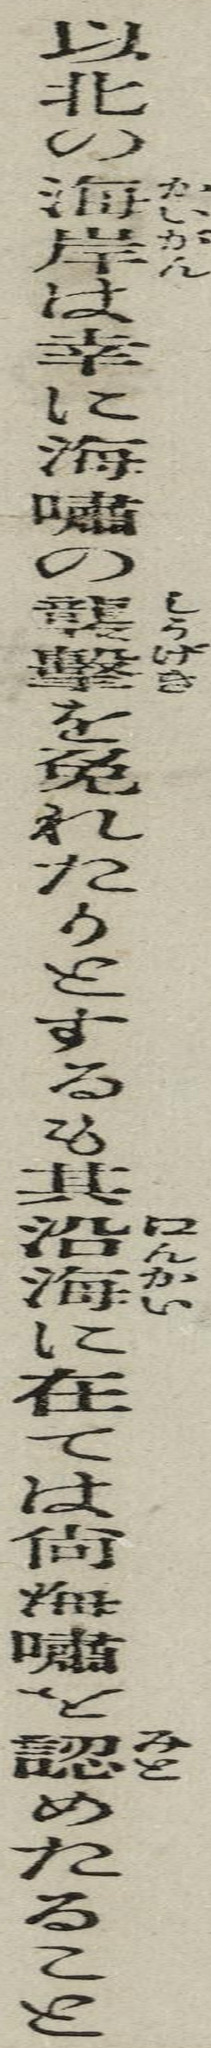以北の海岸は幸に海嘯の襲撃を免れたりとするも其沿岸に在ては尙海嘯を認めたること
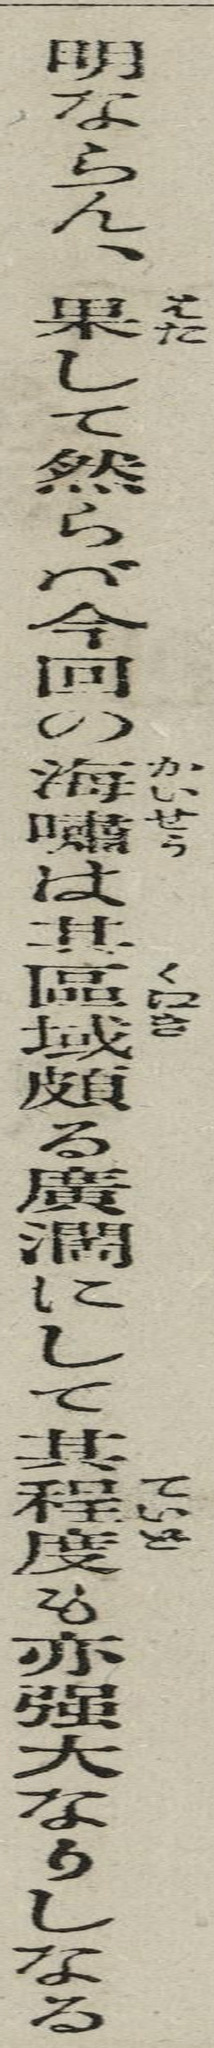明ならん、果たして然らば今回の海嘯は其區域頗る廣濶にして其程度も亦强大なりしなる
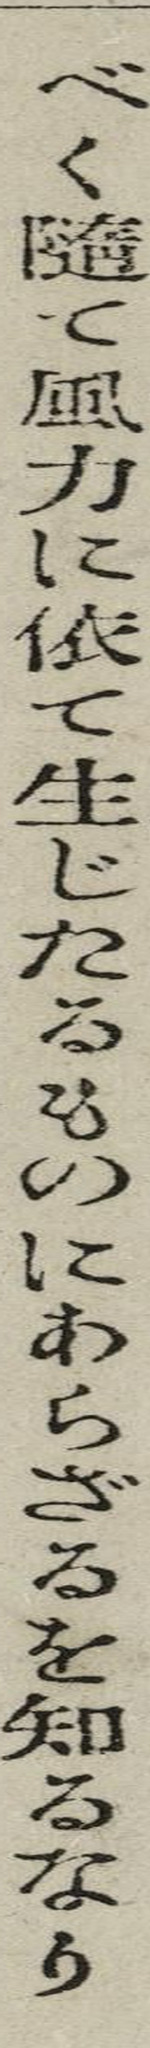べく隨て風力に依て生じたるものにあらざるを知るなり
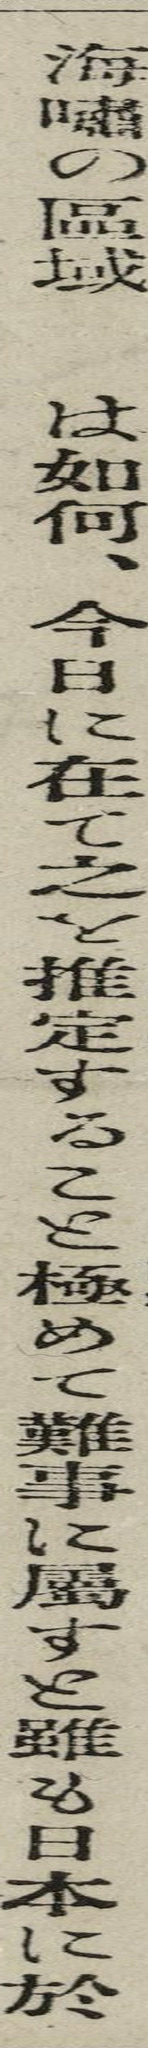海嘯の區域は如何、今日に在て之を推定すること極めて難事に属すと雖も日本に於
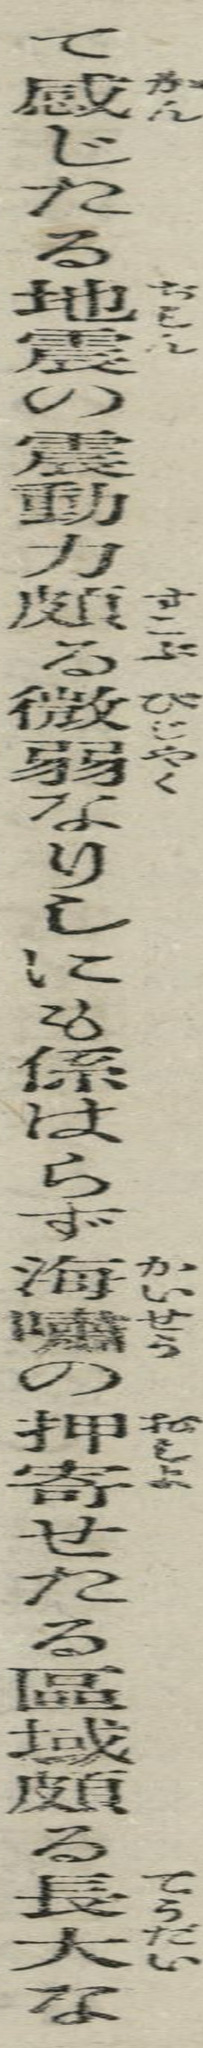て感じたる地震の震動力頗る微弱なりしにも係はらず海嘯の押寄せたる區域頗る長大な
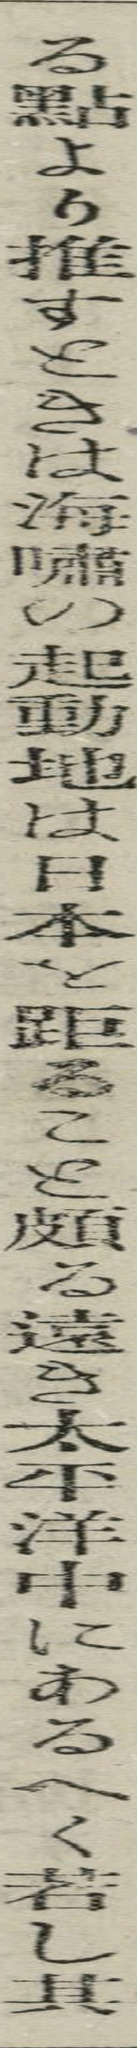る點より推すときは海嘯の起動地は日本を距ること頗る遠き太平洋中にあるへく若し其
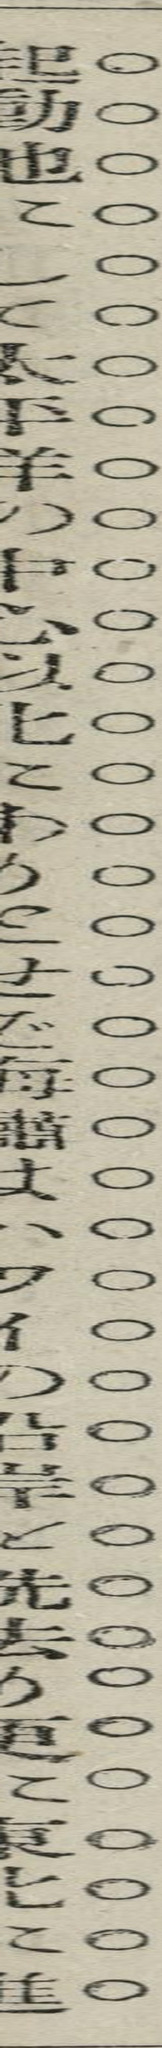起動地にして太平洋の中心以北にありとせば海嘯はハワイの沿岸を洗去り更に東北に進
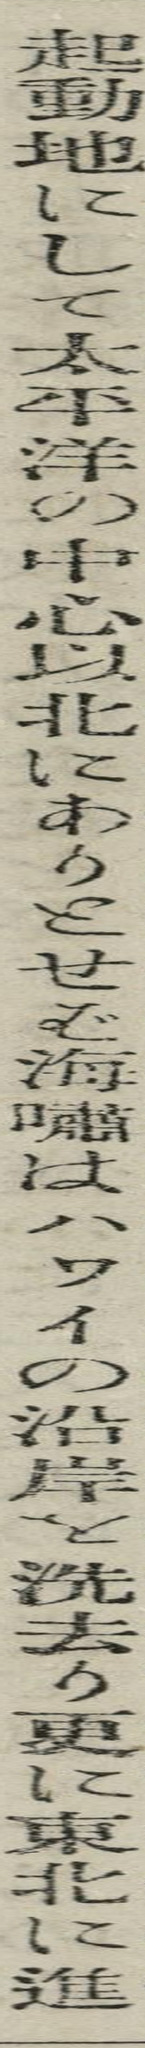起動地にして太平洋の中心以北にありとせば海嘯はハワイの沿岸を洗去り更に東北に進
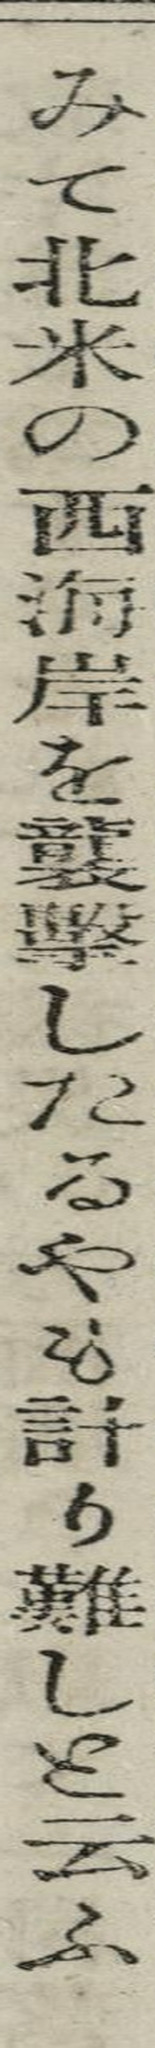みて北米の西海岸を襲撃したるやも計り難しと云ふ
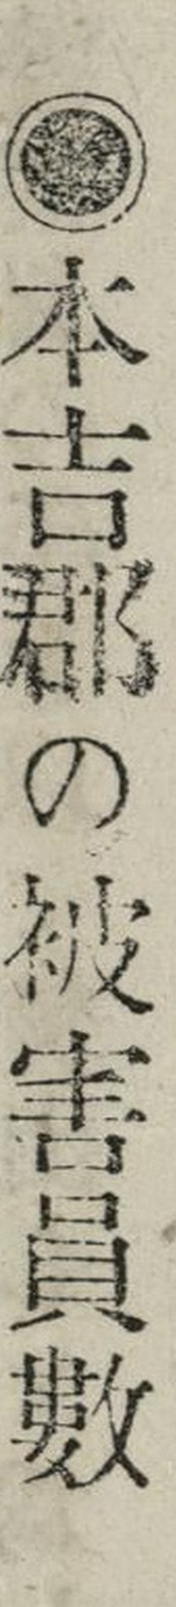●本吉郡の被害員數
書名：三陸海嘯細見
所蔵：東京大学地震研究所図書室 Earthquake Research Institute Library, The University of Tokyo, JAPAN
